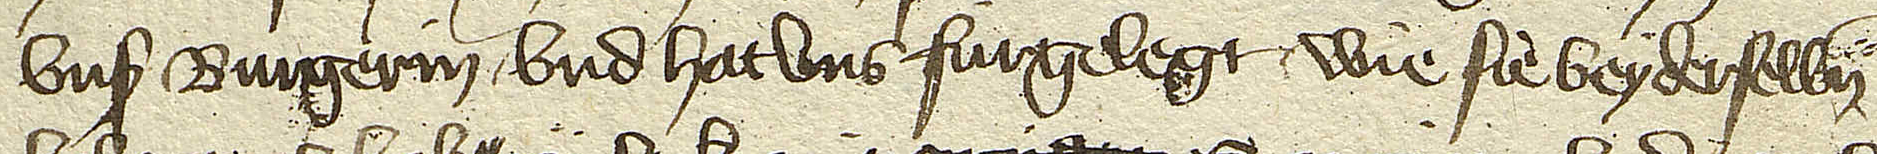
vnſ* Burgerin / vnd hat vns fürgelegt / wie ſie beyderſelbn*
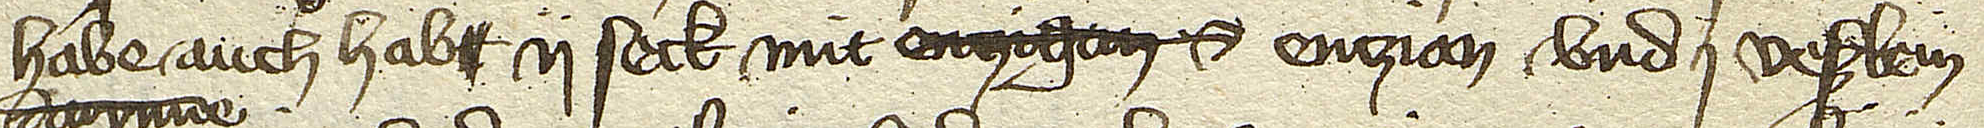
habe / auch habt ii ſeck mit encʒigan % encʒian / vnd i veſʒlein
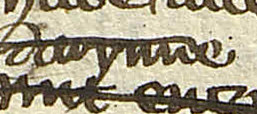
darynne
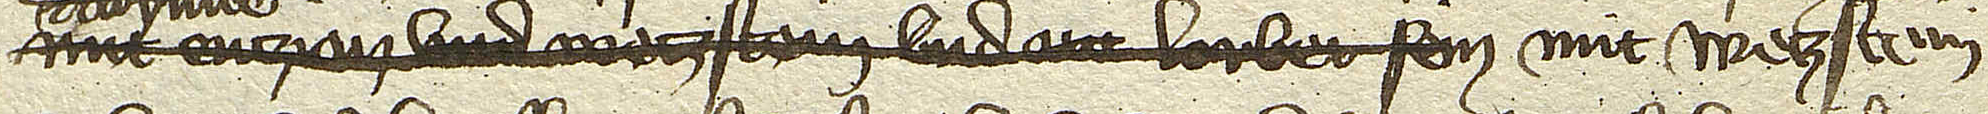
mit encʒian vnd wecʒſtein vnd ain lorber ſein mit wecʒſtein
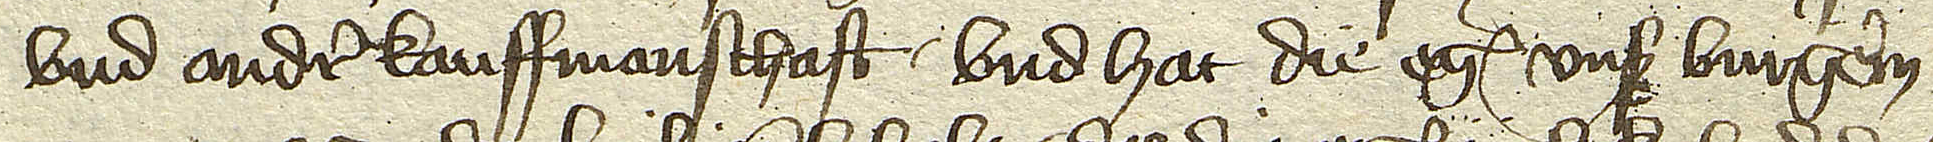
vnd andr* kauffmanſchaft / vnd hat die eg* vnſ* burge*in
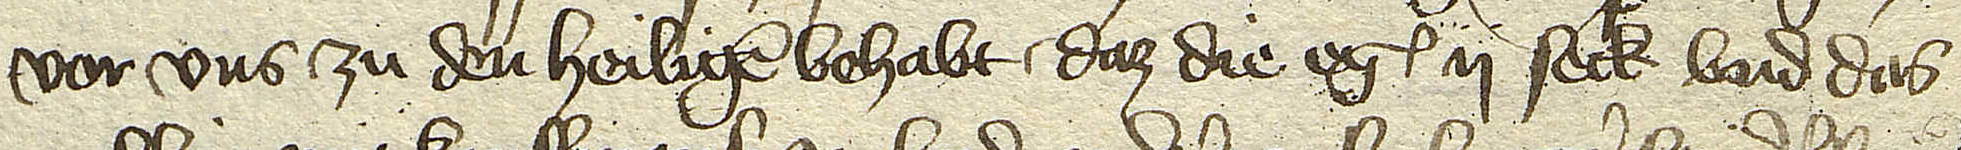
vor vns cʒu den heilige* behabt / daʒ die eg* ii ſeck vnd das
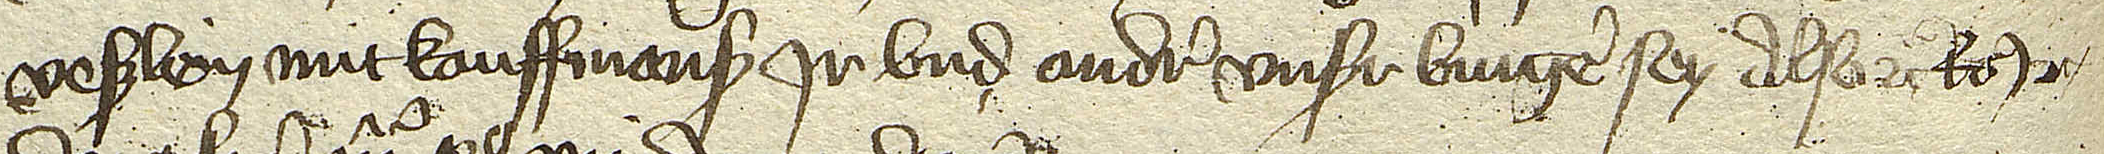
veſʒlein mit kauffmanſ* Ir vnd andr* vnſer burge* ſey Alſo ec* Ro* ec*
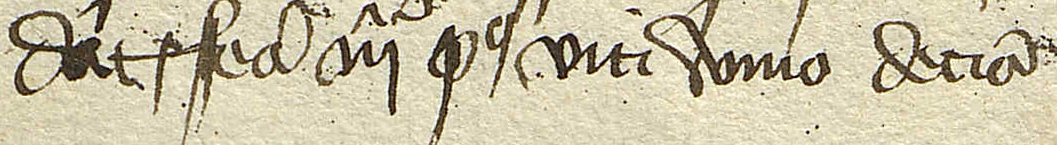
Dat* fea* iii* p* viti Anno decio*
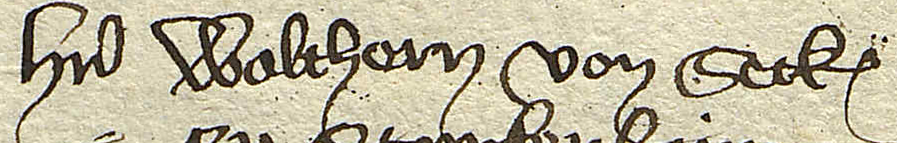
hn* Walthern von Seck*
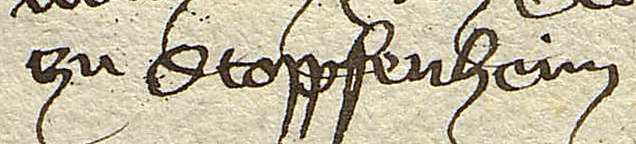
cʒu Stoppfenheim
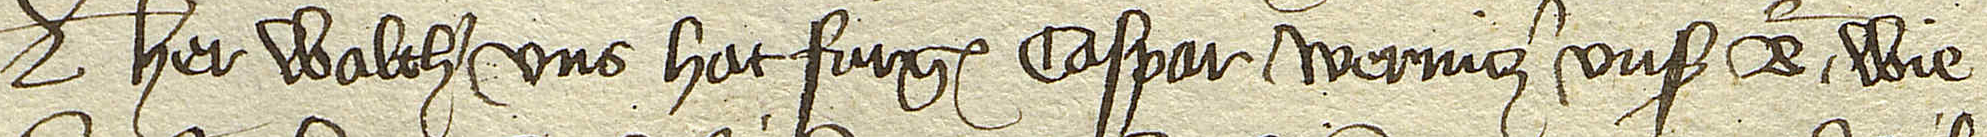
L* her Walth* vns hat fürg* Caſpar wernicʒ* vnſ* B* / wie
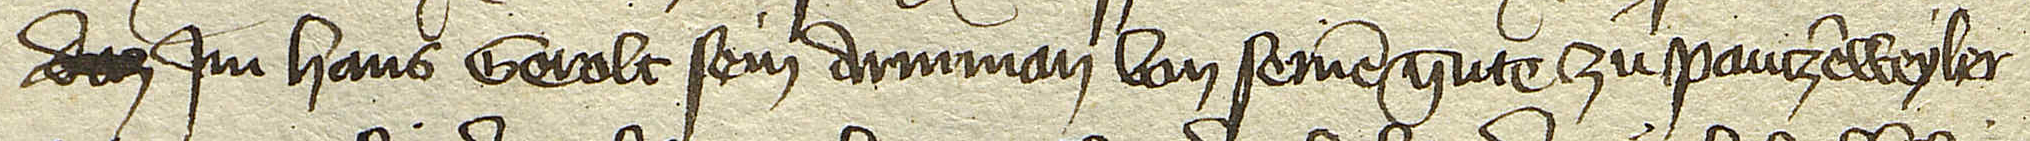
daʒ Im hans Gerolt ſein Armman von ſeine* gute cʒu paucʒe*weyler
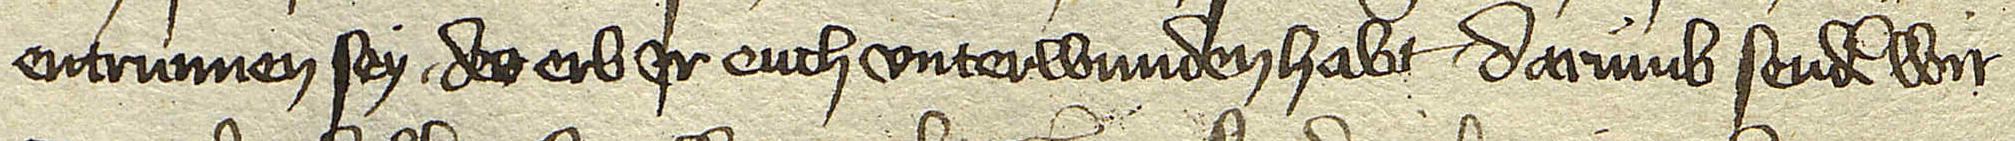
entrunnen ſei / des erb Ir euch vnterwunden habt / Darümb ſend* wir
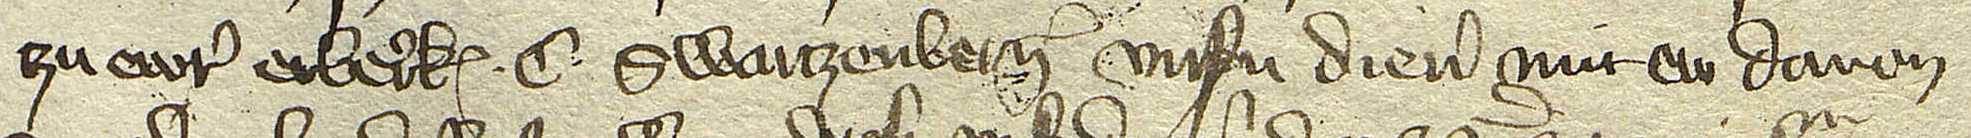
cʒu ewr* erberk* C . Swarcʒenberg* vnſ*n dien* mit ew dauon
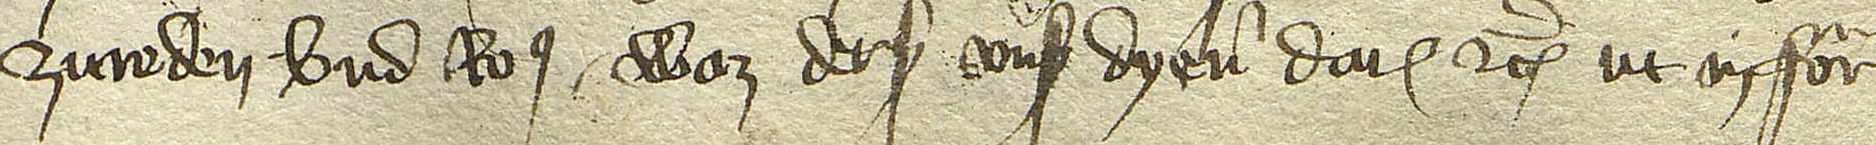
cʒureden vnd Ro* / waʒ derſ* vnſ* dyen* dar* ec* ut in for*
